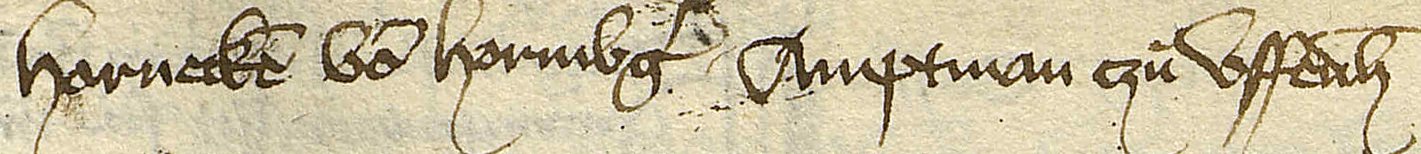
hornecke* vo* hormbg* / Amptman cʒü Vffenh*
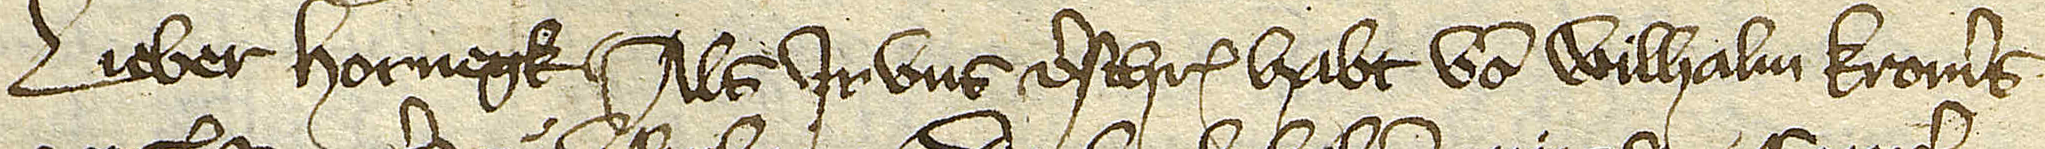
Lieber hornegk / Als Ir vns v*ſchr* habt vo* wilhalm Krom*s
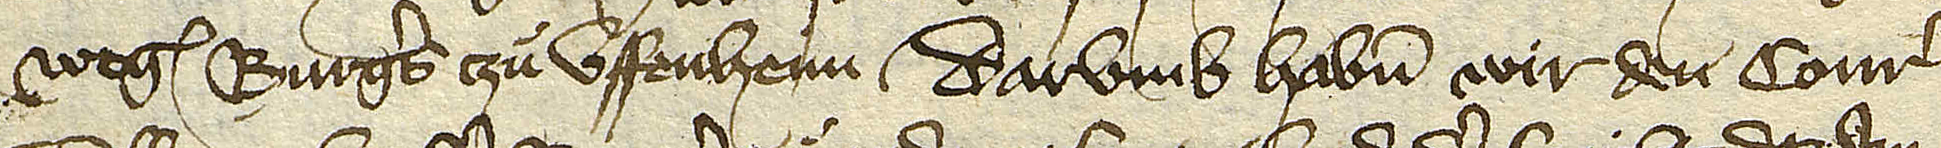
weg* Burg*s cʒü Vffenheim / Darvmb habn* wir den Conr*
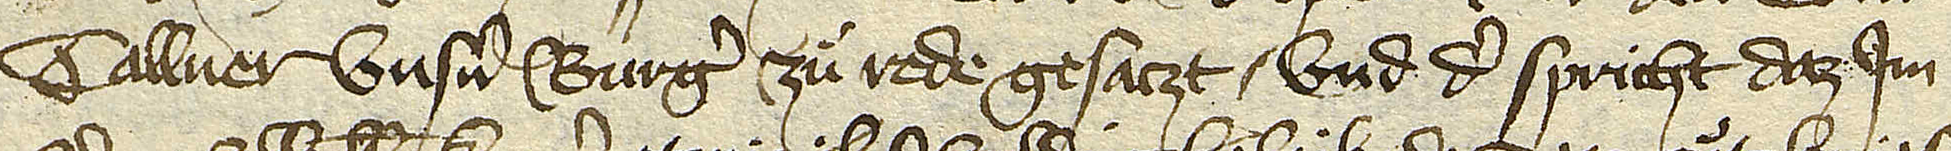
%allner vnſn* Burg* cʒü rede geſacʒt / vnd d* ſpricht daʒ Im
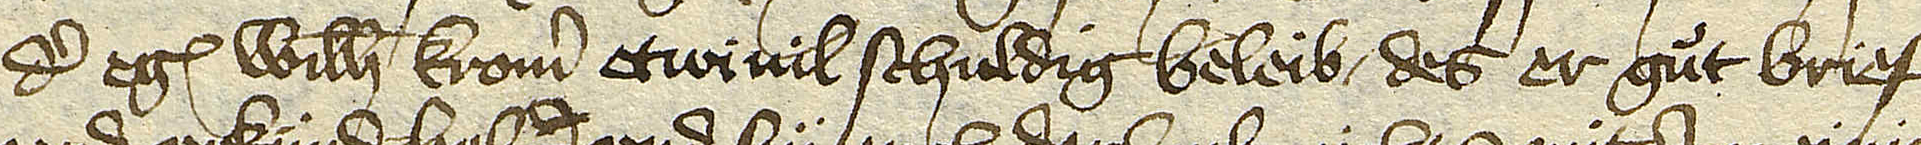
d* eg* wilh* Krom* etwiuil ſchuldig beleib / des er güt brief
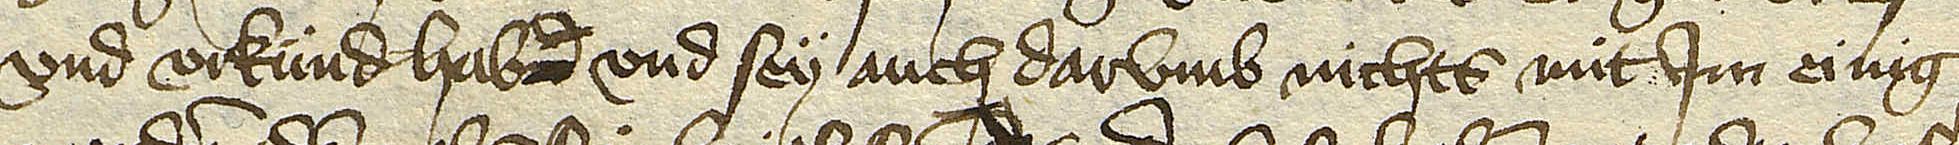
vnd vrkünd habn* vnd ſey auch darvmb nichts mit Im einig
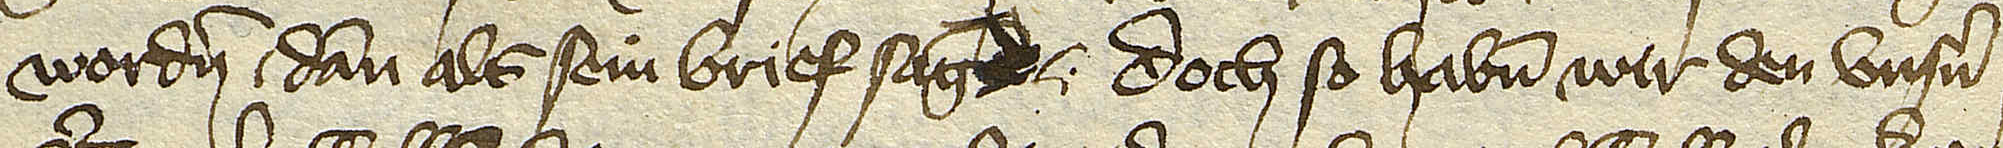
wordn* / dan* als ſein brief ſage* / . Doch ſo habn* wir den vnſn*
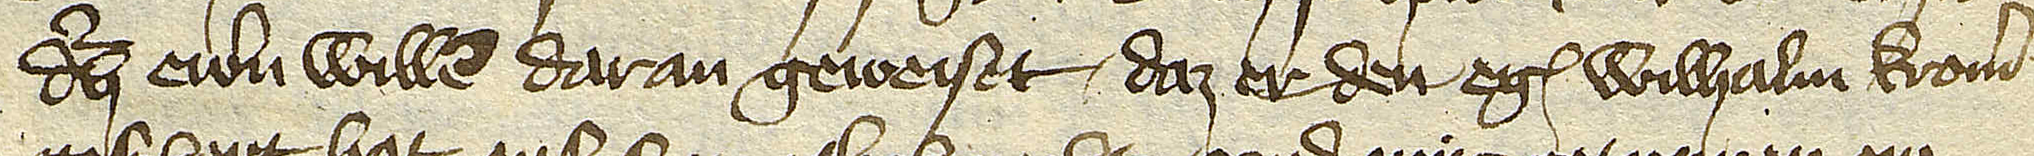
d*h ew*n wille* daran geweiſet / daʒ er den eg* wilhalm Krom*
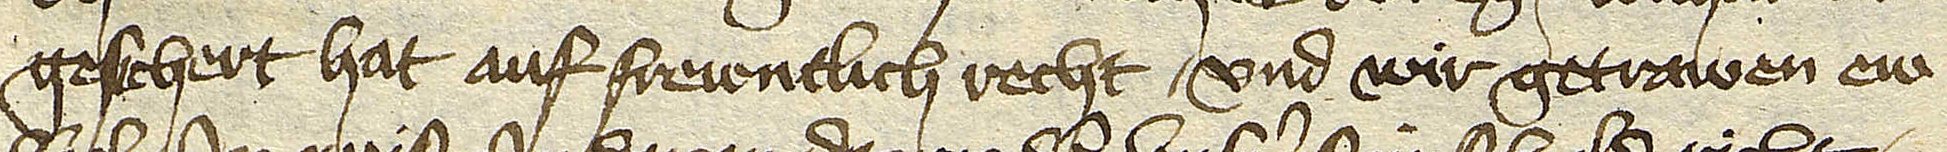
geſichert hat auf frewntlich recht / vnd wir getrawen ew
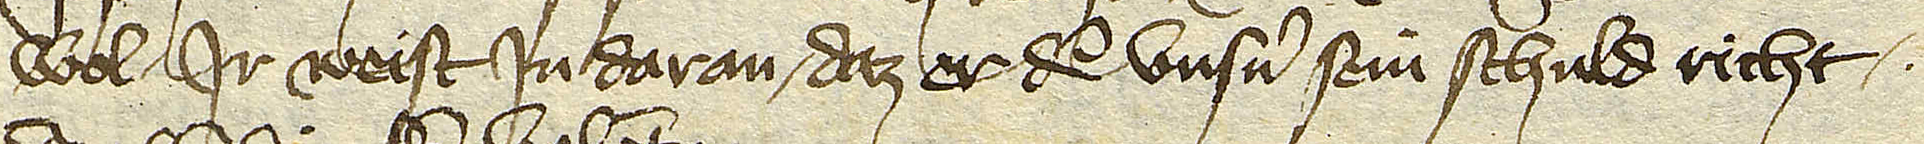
wol / Ir weiſt In daran / daʒ er d* vnſn* ſein ſchuld richt / .
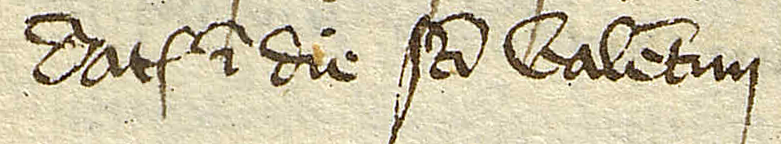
Dat* i* die ſci* Vale*tini
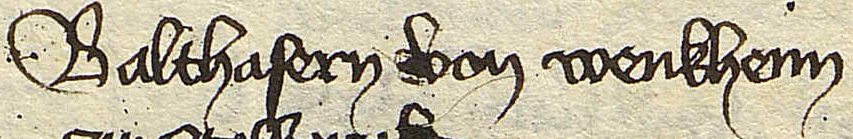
Balthaſern von wenkheim
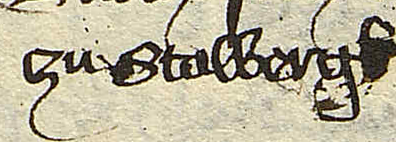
cʒu Stolbergk
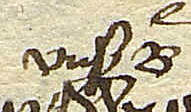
vnſ* B*
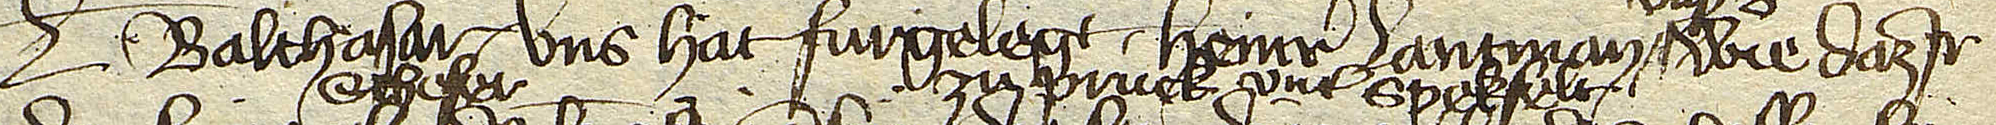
L* Balthaſar / vns hat fürgelegt / heinr* lantman / wie daʒ Ir
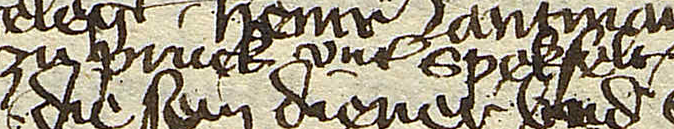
cʒu Pruck vnt* Spekfelt
